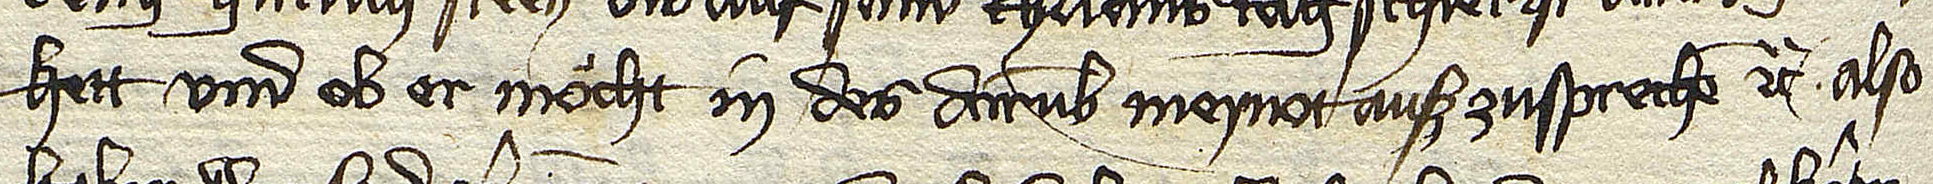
hett vnd ob er möcht in des daru*b meynot auſʒ ʒuſpreche* ec* . alſo
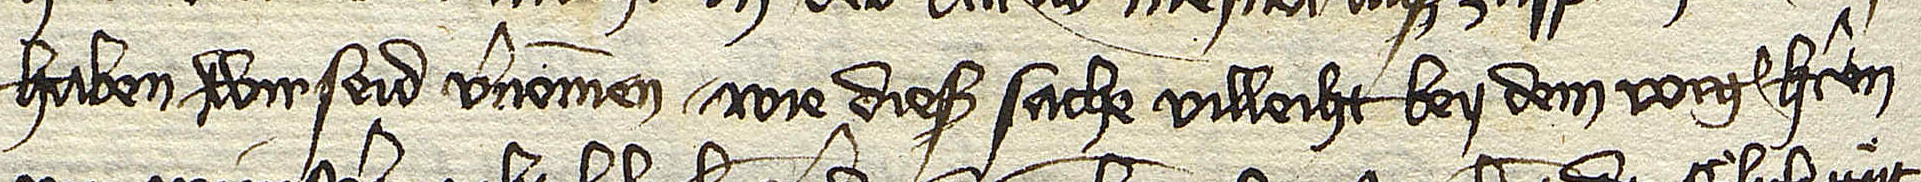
haben wir ſeid v*nomen* / wie dieſ* ſache villeiht bey dem vorg* h*ren
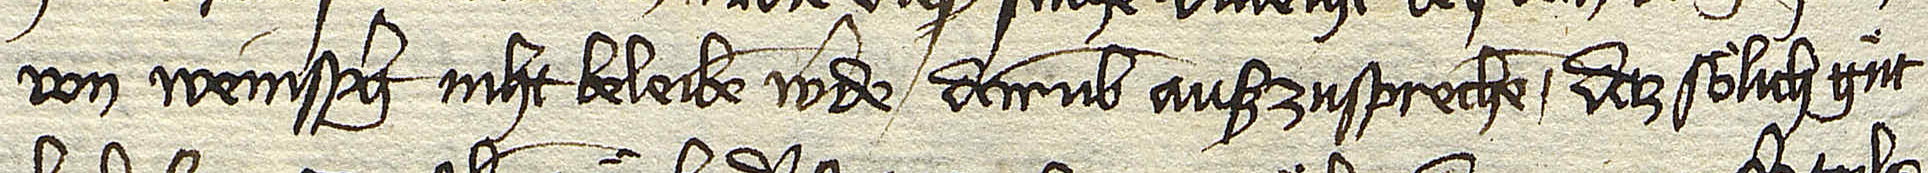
von weinſp*g niht beleibe w*de daru*b auſʒʒuſpreche* / daʒ ſölich güt
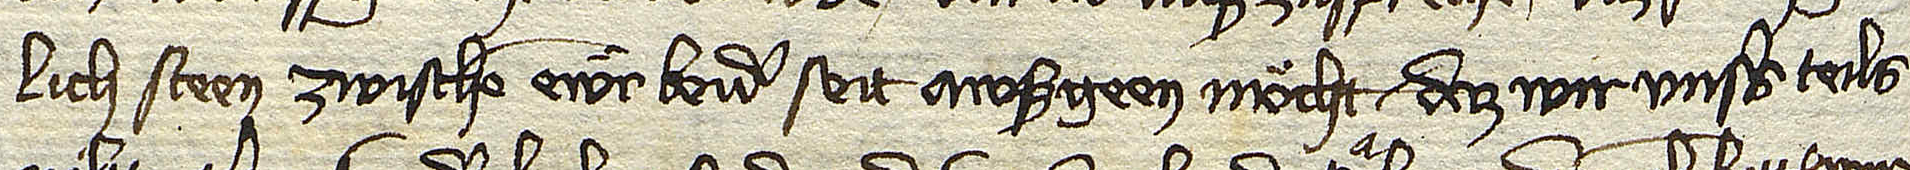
lich ſteen ʒwiſche* ewr beid*ſeit awſʒgeen möcht / daʒ wir vnſ*s teils
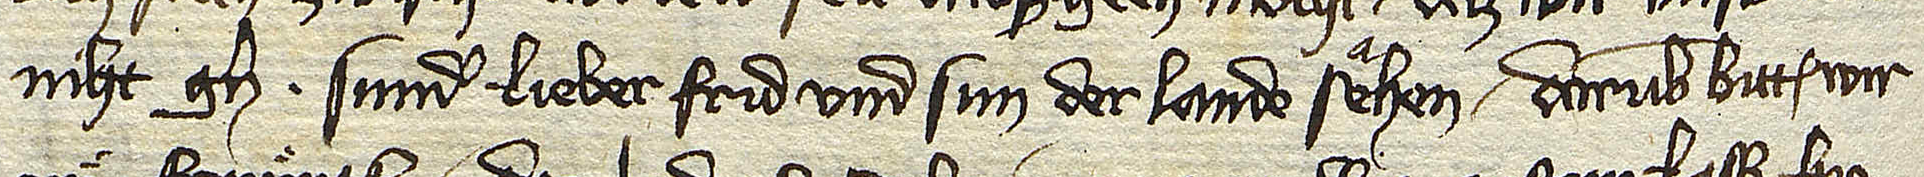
niht g*n . ſund* lieber frid vnd ſun der lande ſëhen / daru*b bitt* wir
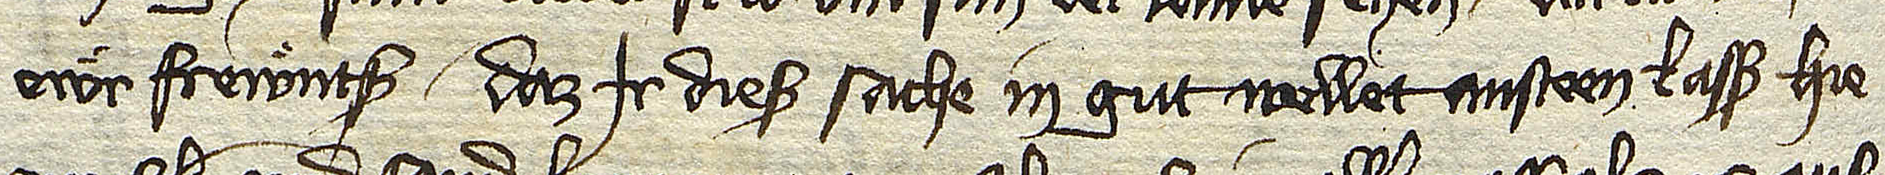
ewr frewntſ* / daʒ Ir dieſ* ſache in gut wellet auſteen laſſ* hie
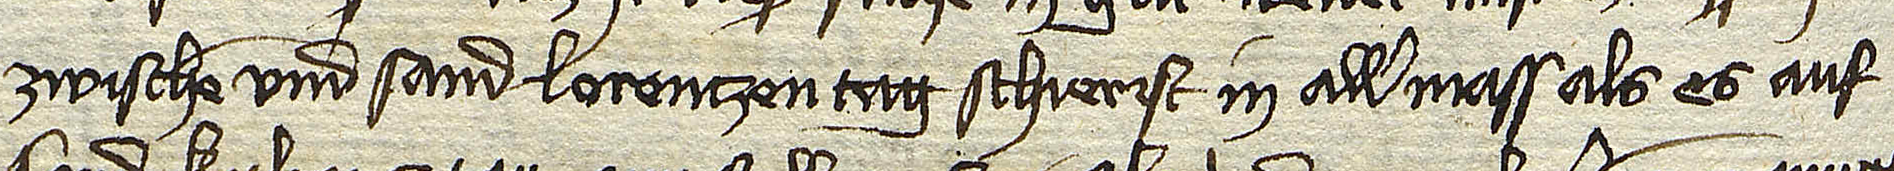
ʒwiſche* vnd ſand lorencʒen tag ſchieriſt in all* maſſ als es auf
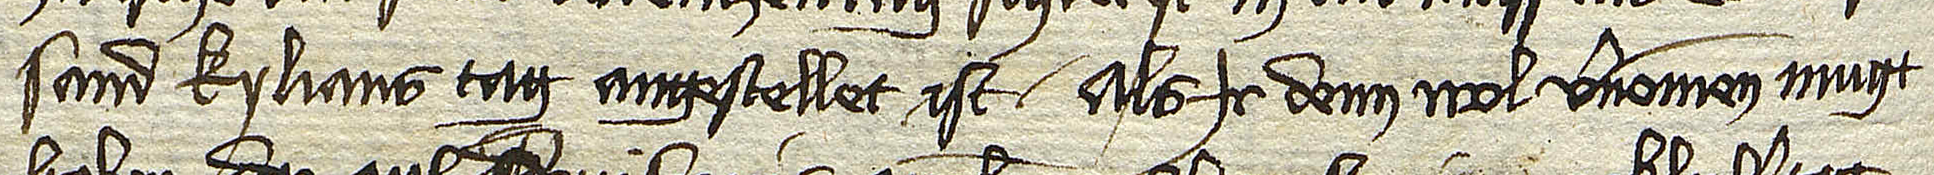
ſand kylians tag angeſtellet iſt / Als Ir denn wol v*nomen* mugt
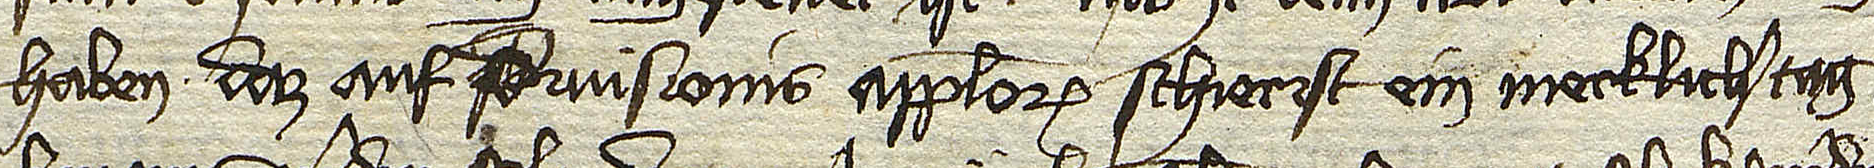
haben. daʒ auf Diuiſionis applo* ſchieriſt ein merklich* tag
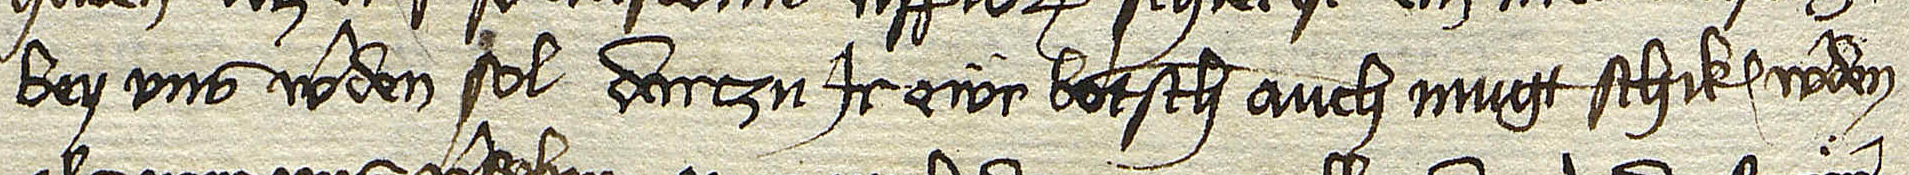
bey vns w*den ſol darcʒu Ir ewr botſch* auch mugt ſchik* w*den
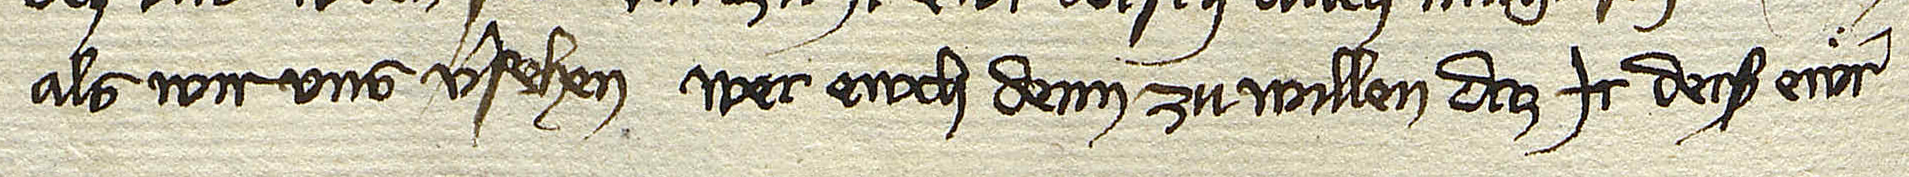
als wir vns v*ſehen wer ewch denn ʒu willen daʒ Ir derſ* ew*r
